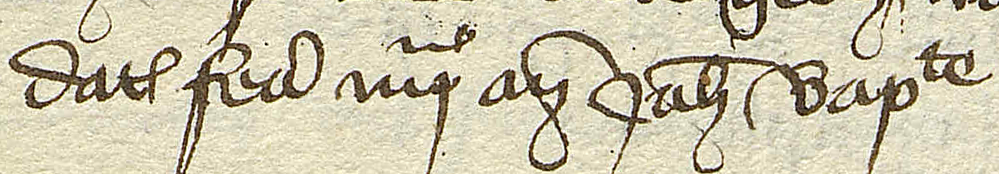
dat* fea* iiii* an* Ioh* Bap*
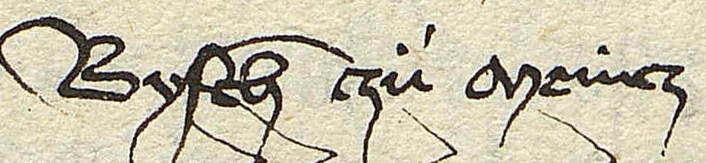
Byſch* cʒü Meincʒ
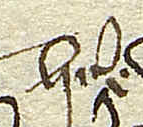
hr*e
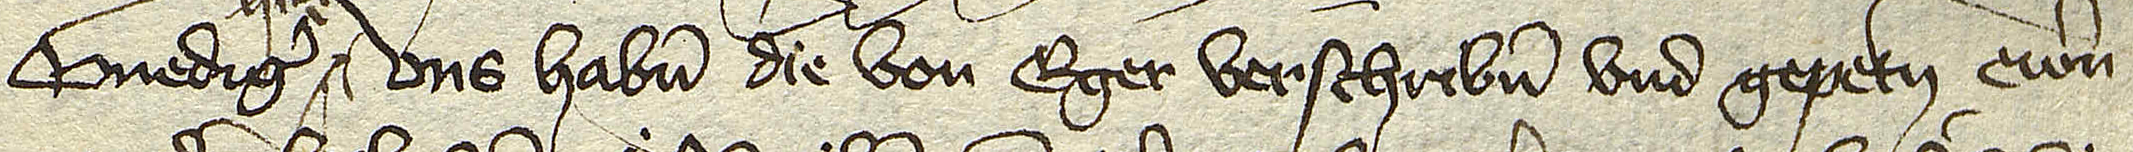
Gnedig* / Vns habn* die von Eger verſchribn* vnd gepetn* ew*n
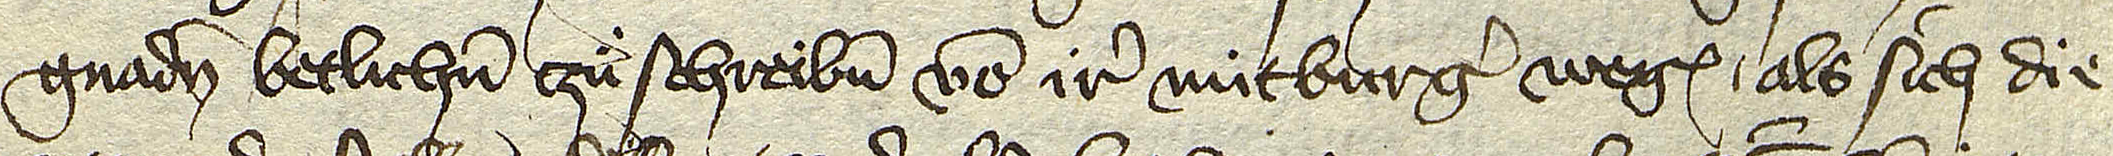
gnadn* betlichn* cʒü ſchreibn* vo* ir* mitburg* weg* / als ſich die
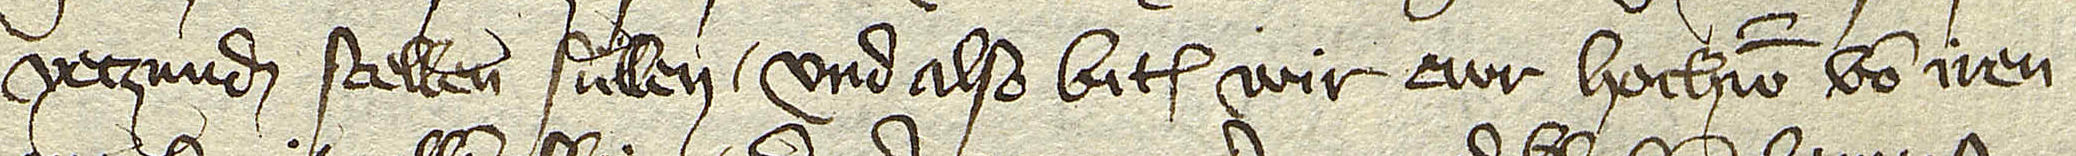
yecʒund* ſtellen ſüllen / vnd alſo bit* wir ewr hochw* vo* iren
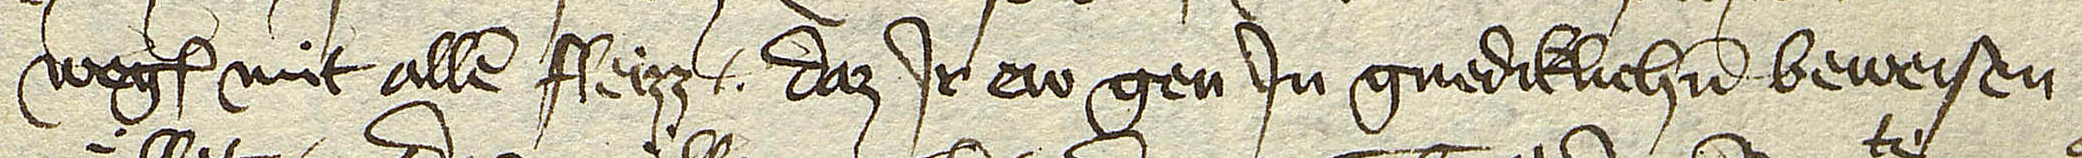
weg* mit alle* fleiʒʒ / . daʒ Ir ew gen In gnediklichn* beweiſen
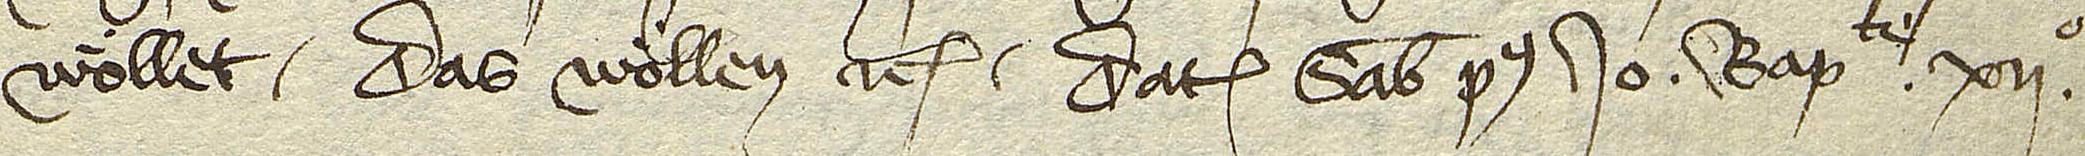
wöllet / Das wöllen ec* / Dat* Sab* p* Io . Bap* . xii* .
